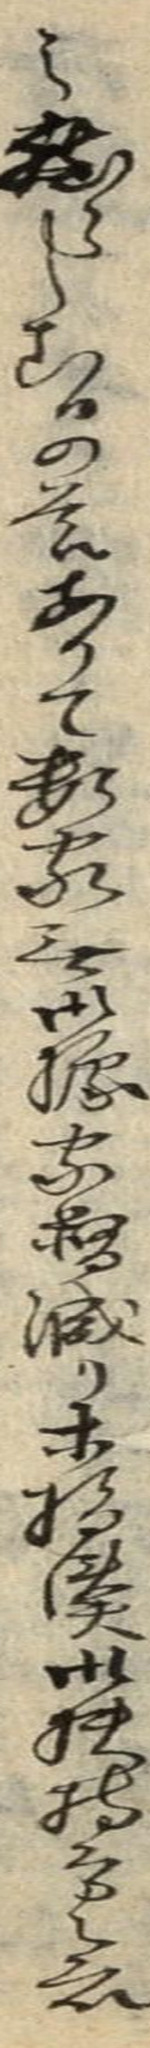之然らしむるの節ありて数家無御拠家督減り等指湊御扶持方之衆
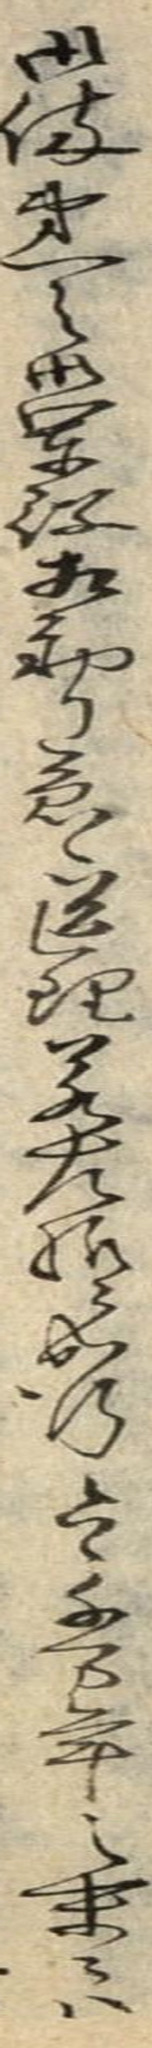御備第一之御軍役相勤り兼候道理若左様ニ成行候ハヽ千万年之末々ハ
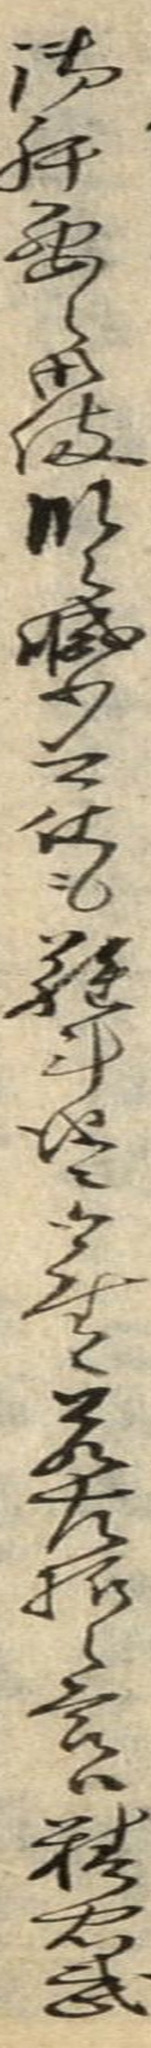御肝要之御備段々減少之仕も難計儀ニ御座候若左様之節精忠武
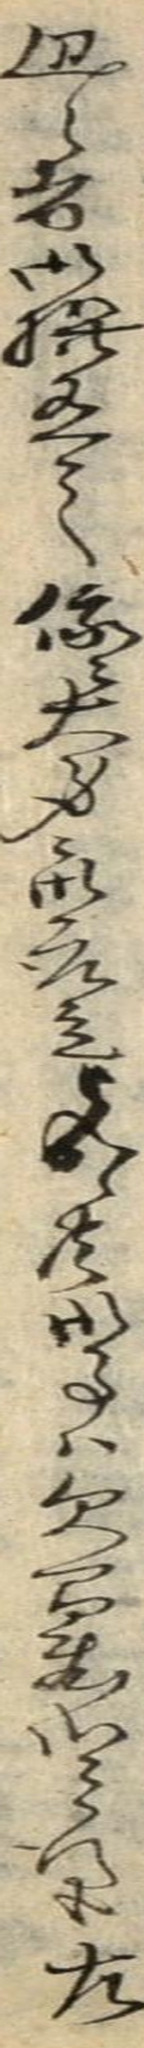辺之者御撰有之俄ニ大身ニ御取立被成候共御事ハ欠間敷哉ニ候得共左
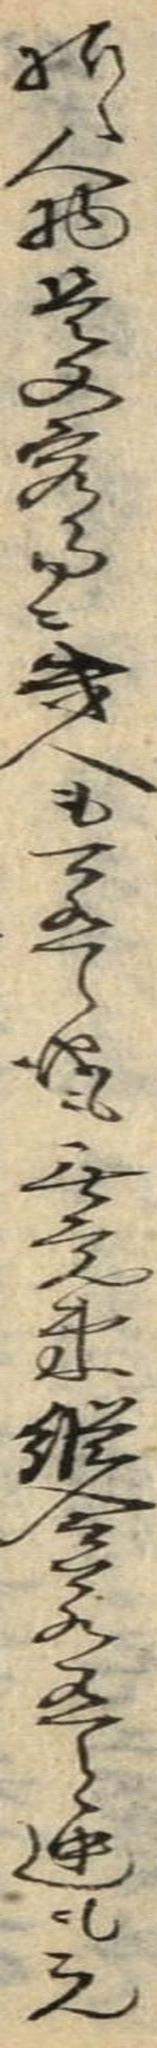様之人物是又容易ニ幾人も可有之儀無覚束仮令若有之迚も元
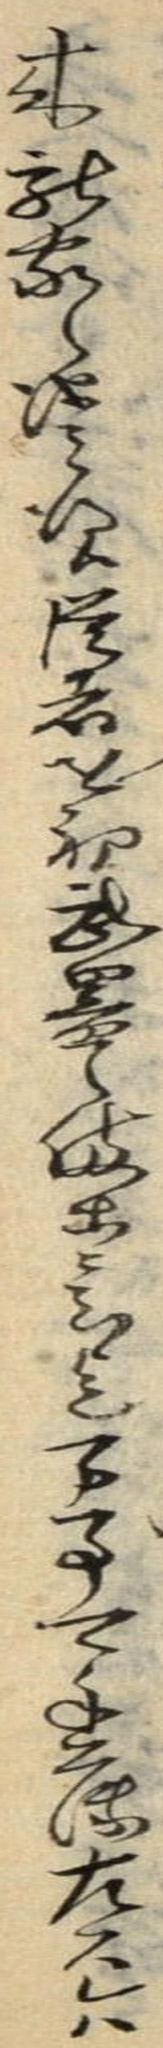来新家之儀ニ候得ハ従者を初武器之備等ニ至迄万事可手薄左スレハ

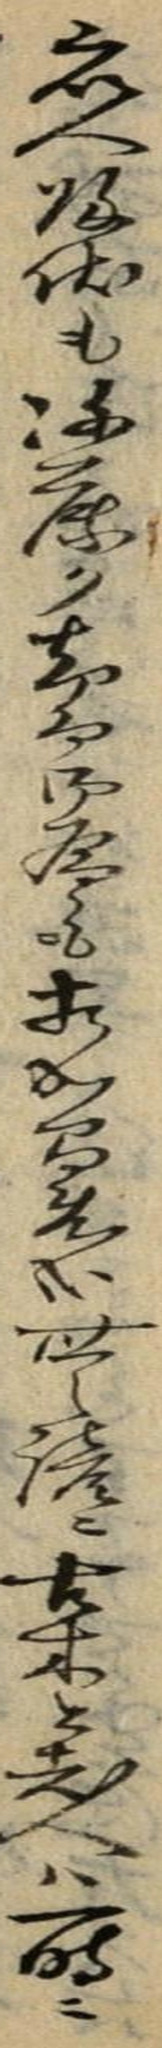衆人帰伏も弥薄ク却而御為二も相成間敷哉世之諺ニ古木と老人ハ一時ニ
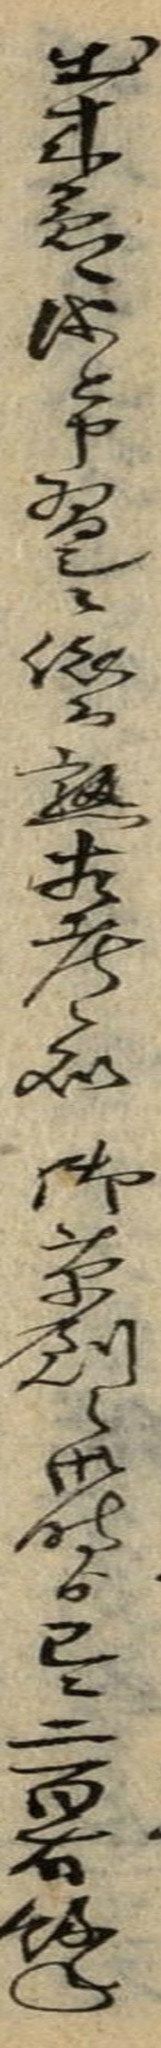出来兼候儀と申習シ候依而熟相考候処御草創之御時ゟ已ニ二百有余年
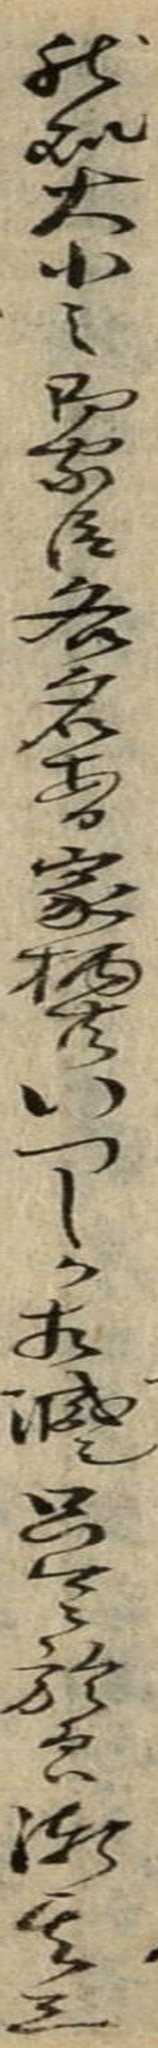然処大小之御家臣各名ある家柄共いつしか相減し只今ニ於而ハ漸其三
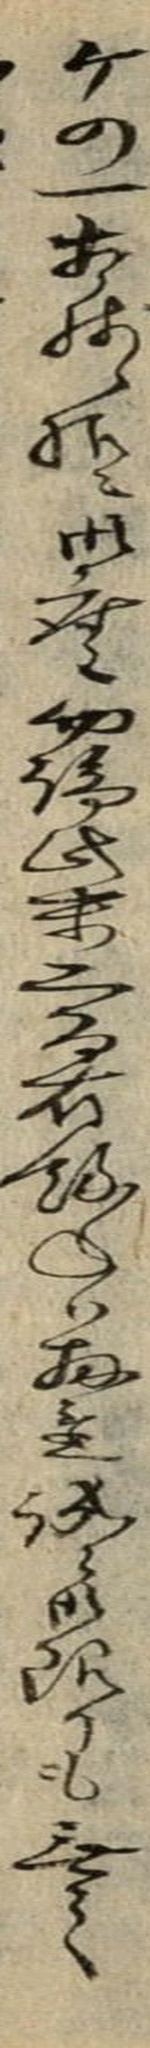ケの一相残候様ニ御座候勿論此末二百有余年ハ扨置誠ニ御限りも無之
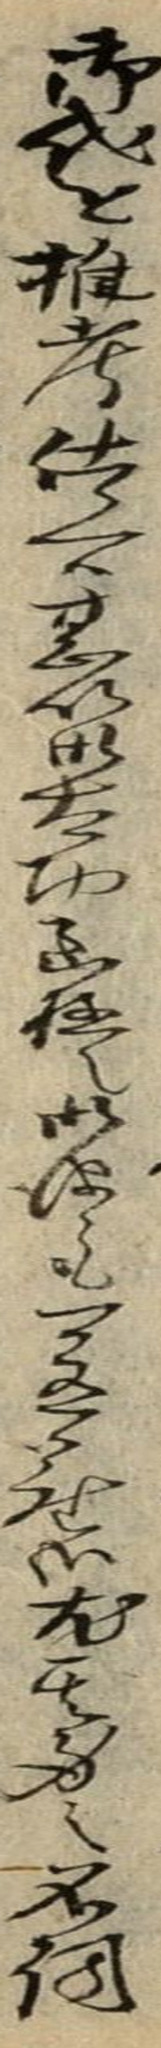御代を推考仕候へハ甚以御太切至極之御儀ニも可有御座哉尤其身之不調
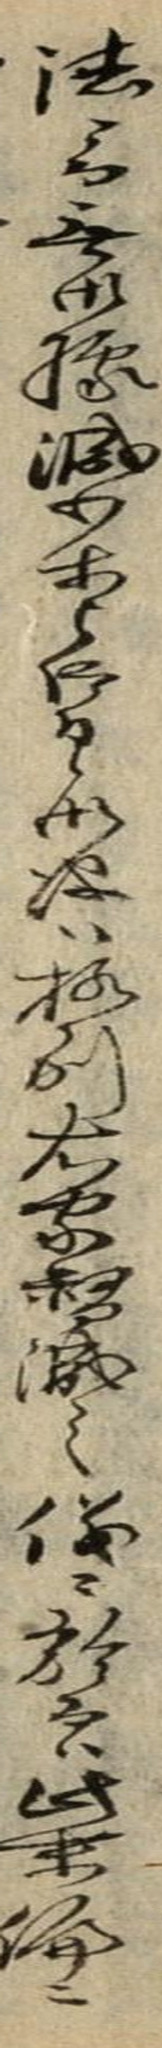法ニ而無御拠減少等被仰付候御儀ハ格別右家督減之儀ニ於而ハ此末偏ニ
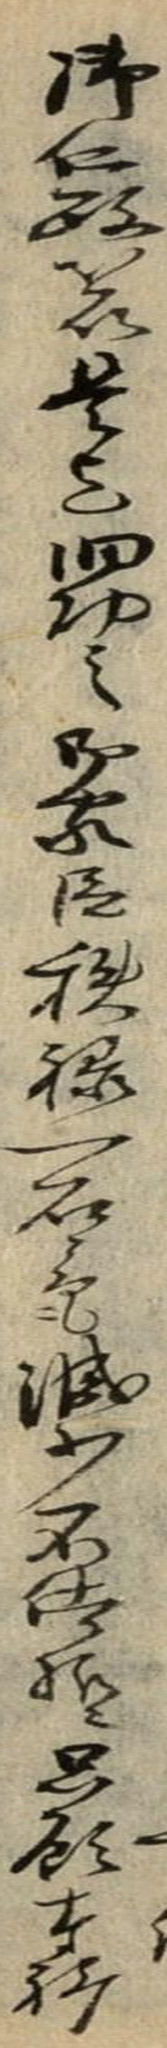御仁政を以其迄旧功之御家臣秩禄一石ニ而も減少不仕候様ニ只願奉祈
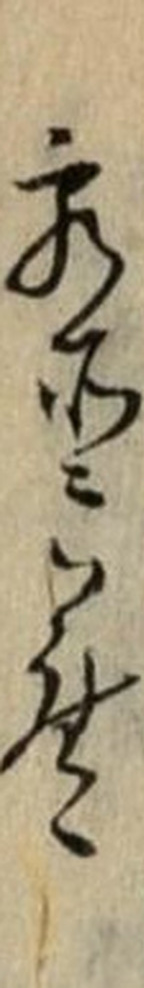願所ニ御座候
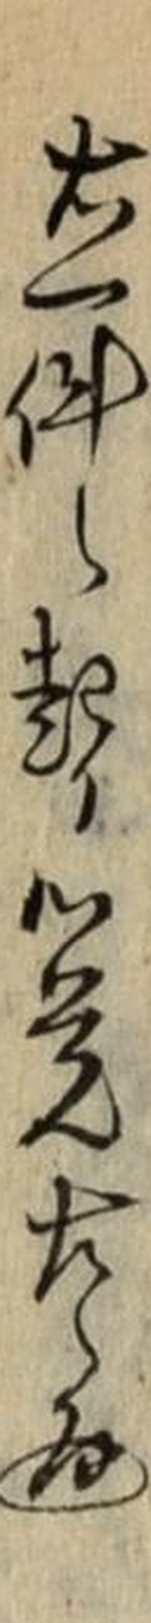右一件之起り候覚左之通
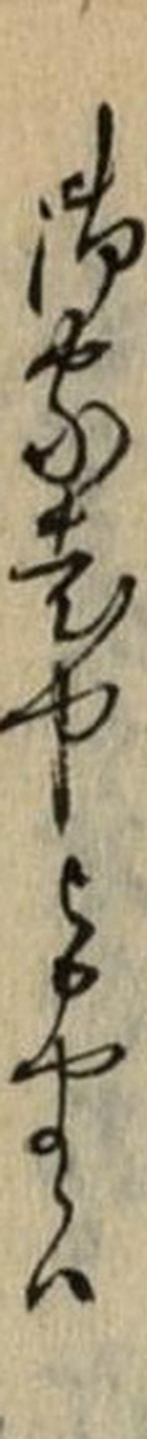御家老中被申聞候ハ
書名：養子縁組之部
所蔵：福井県文書館 Fukui Prefectural Archives
